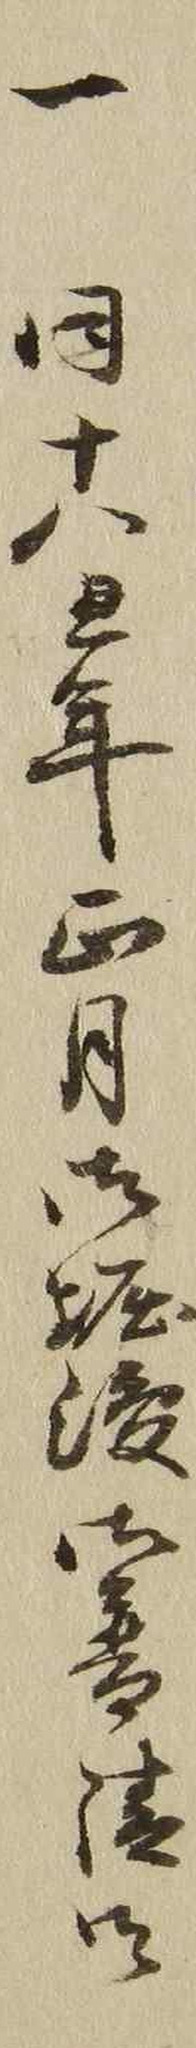一同十八丑年正月御堀浚御普請御
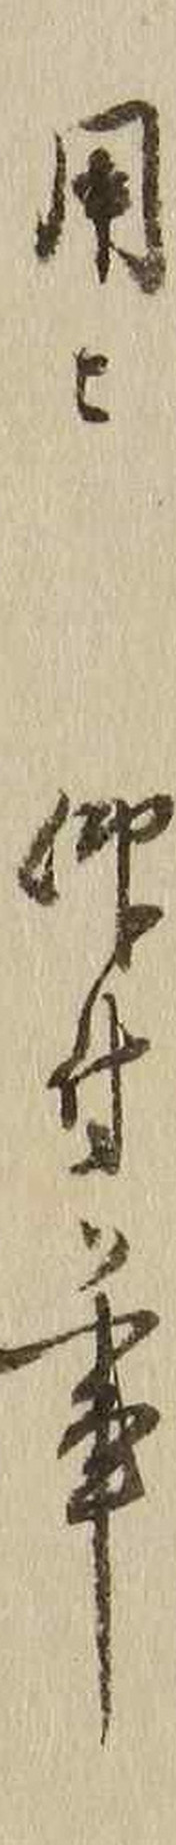用被仰付候事
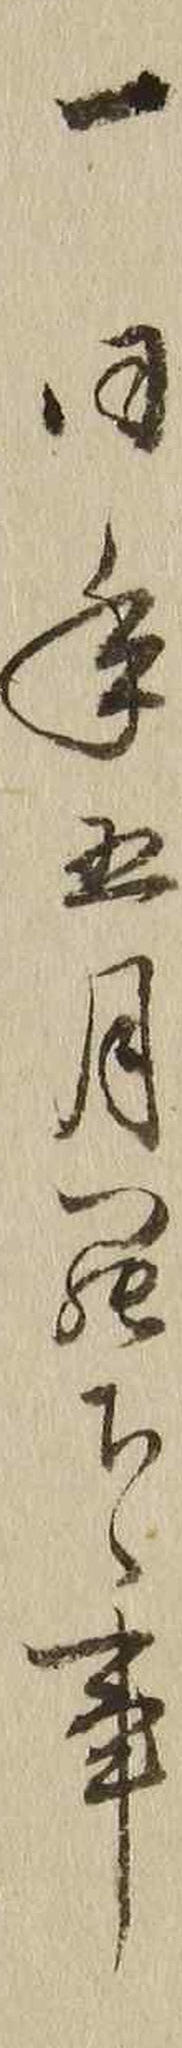一同年五月罷下候事
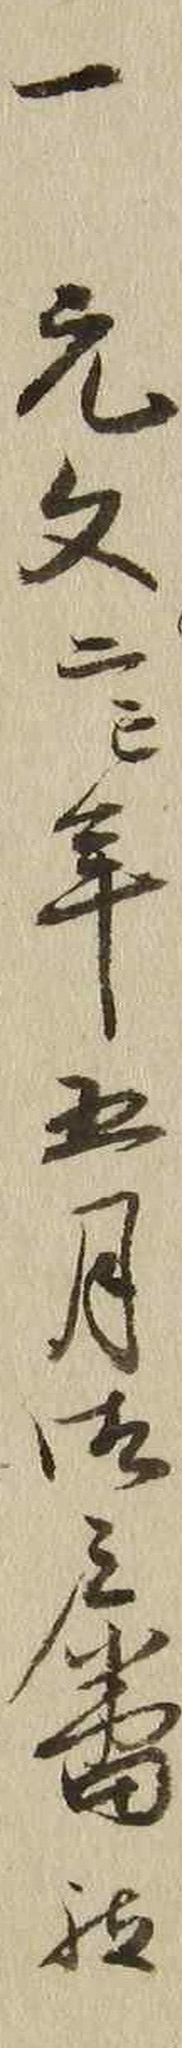一元文二巳年五月御戸番被
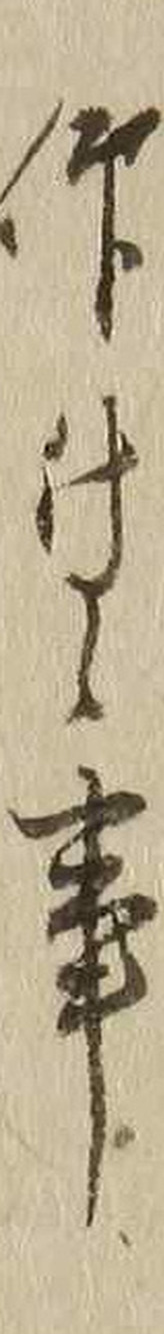仰付候事
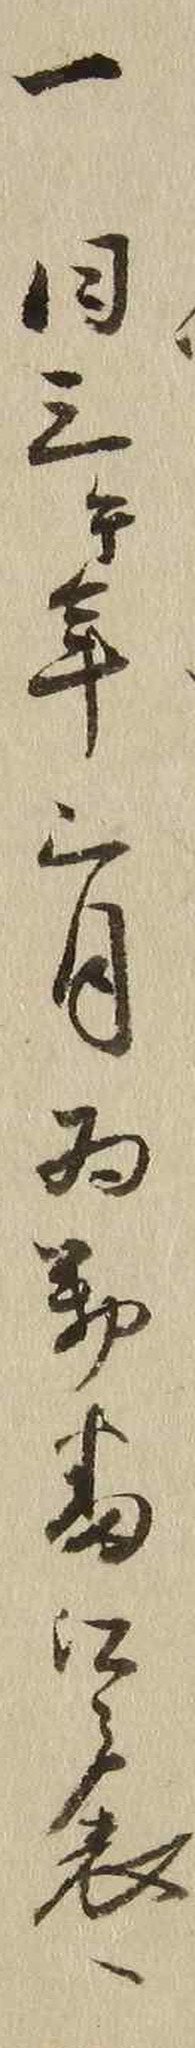一同三午年三月為勤番江戸表へ
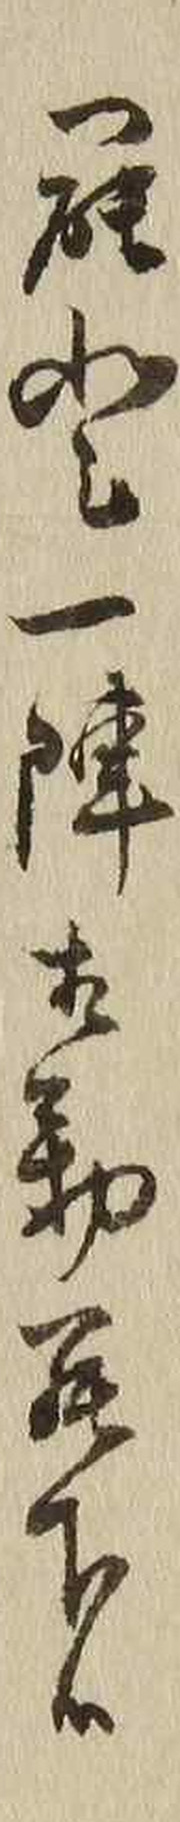罷登一陣相勤罷下候
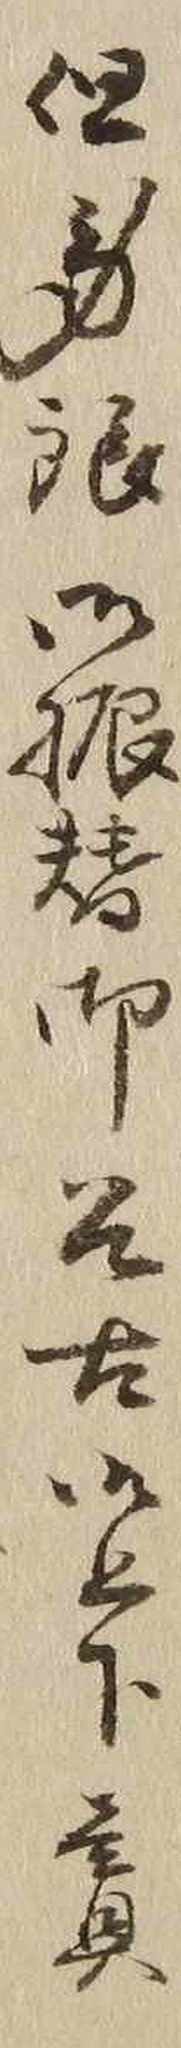但身銀御振替御召古御上下壱具
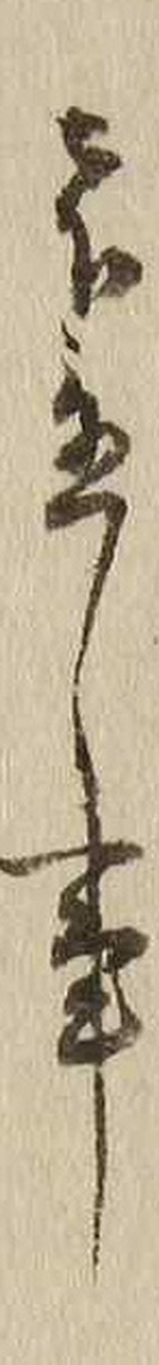被下置候事
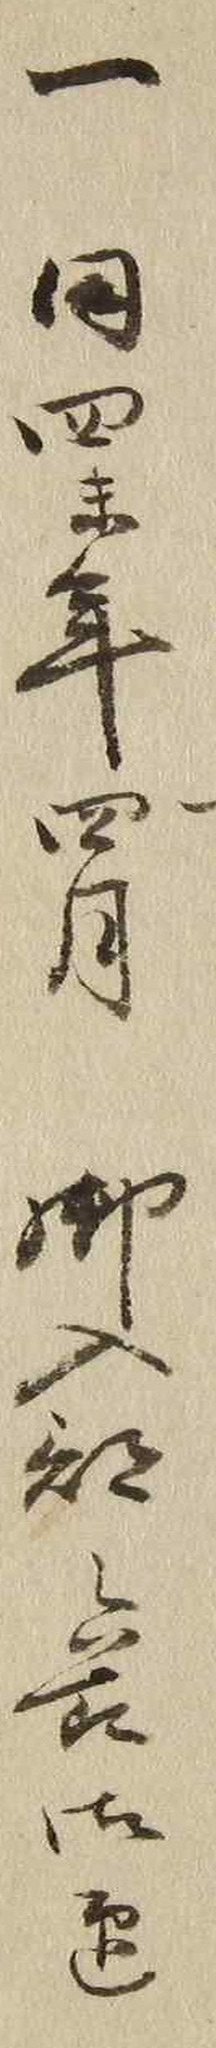一同四未年四月御入部之節御迎
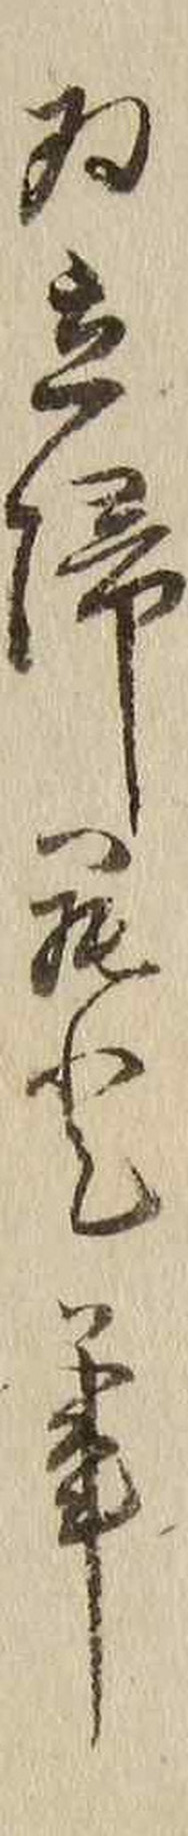為立帰罷登候事
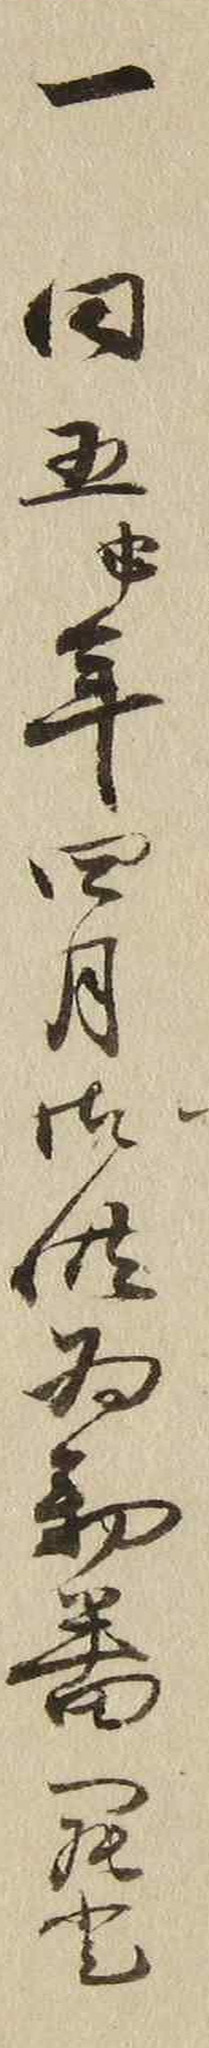一同五申年四月御供為勤番罷登
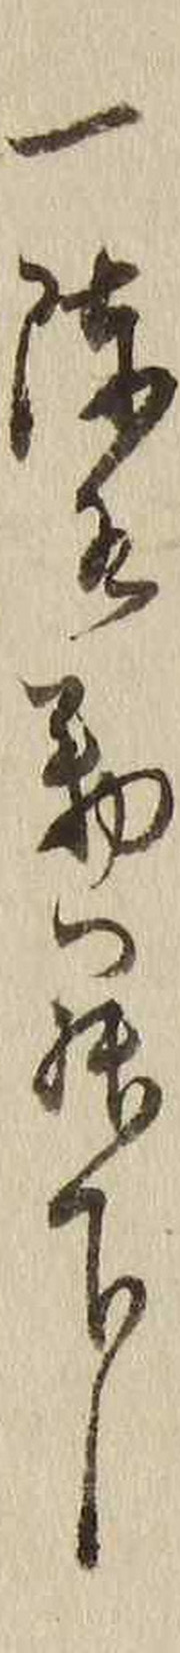一陣相勤罷下候
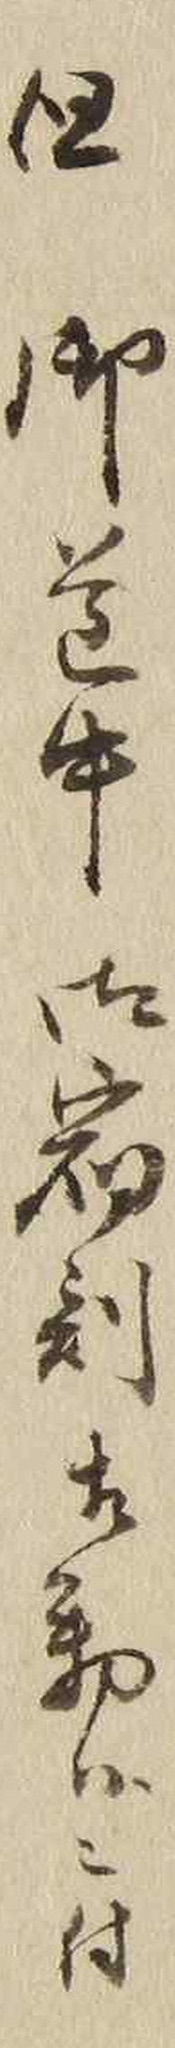但御道中御宿割相勤候ニ付
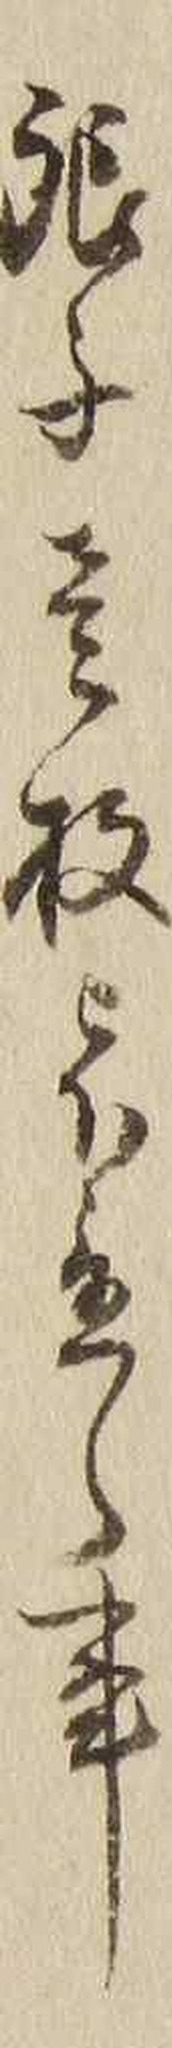銀子壱枚被下置候事
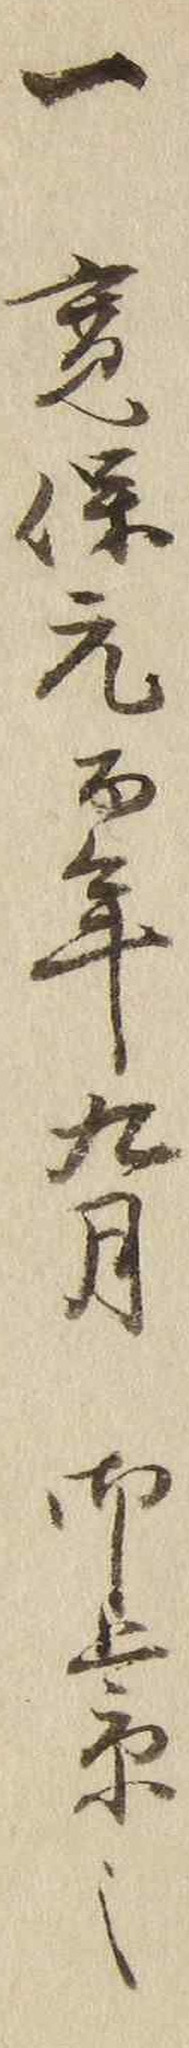一寛保元酉年九月御上京之
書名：諸士系譜　巻之225　ま之部6
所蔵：会津若松市立会津図書館
